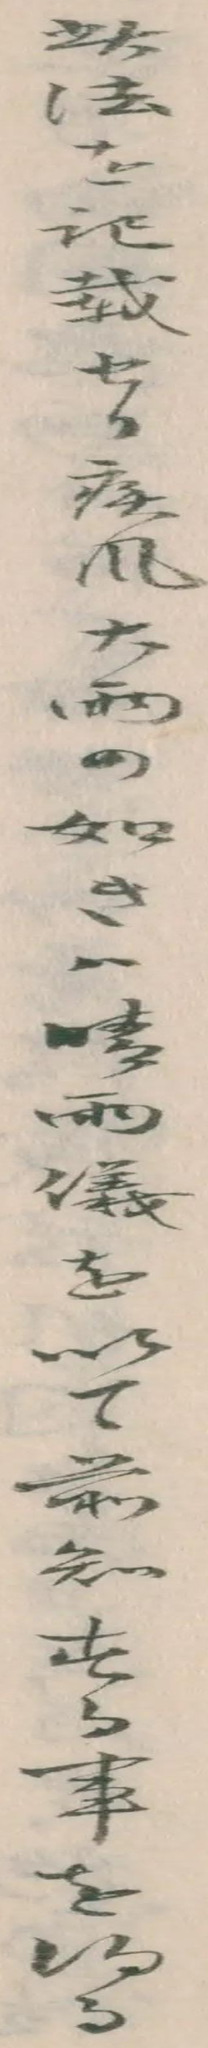此法を記載せり疾風大雨の如きは晴雨儀を以て前知する事を得る
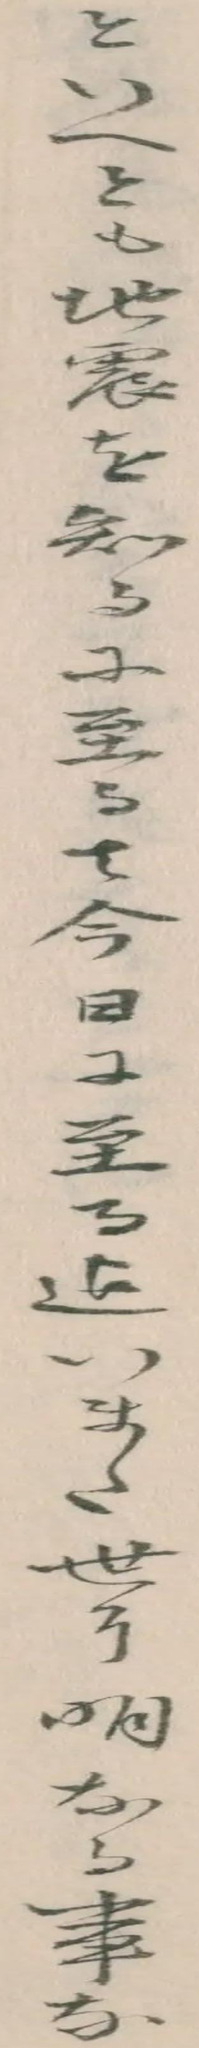といへとも地震を知るに至るは今日に至る迄いまた世に明なる事な
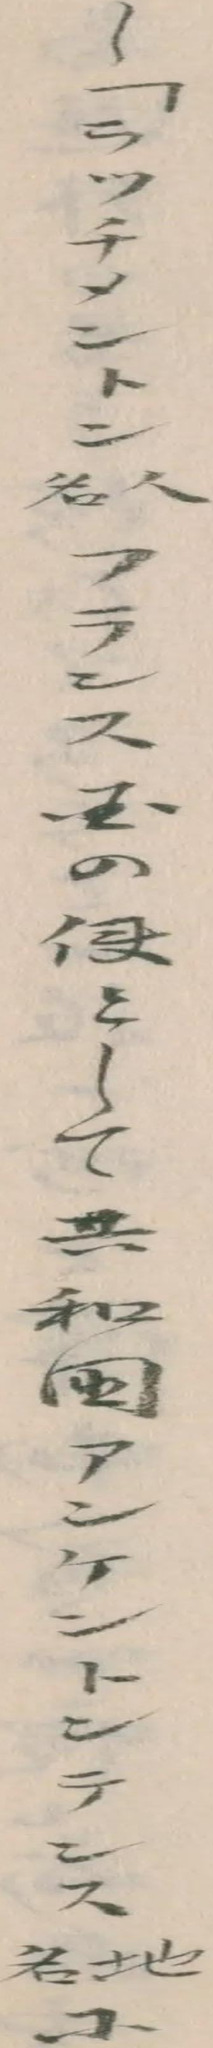し「ラツチメントン人名フランス国の使として共和国アンケントンテンス地名に
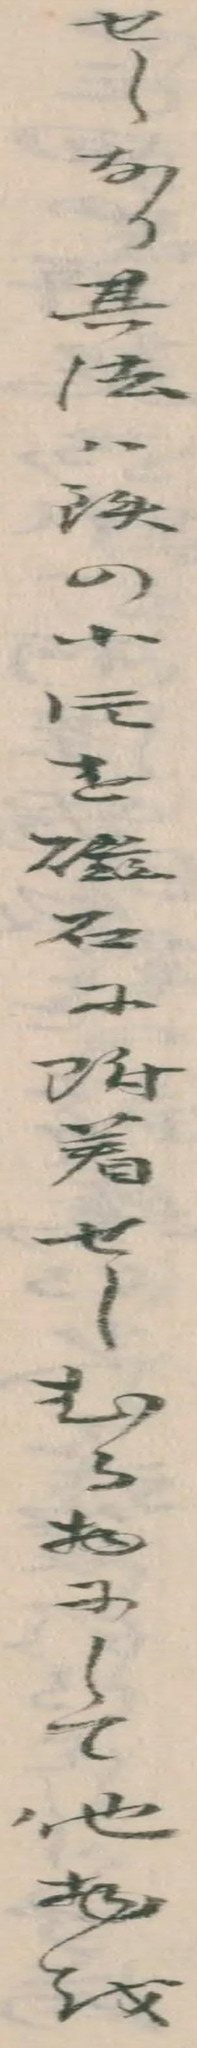せしなり其法は鉄の小片を磁石に附着せしむる物にして他物を
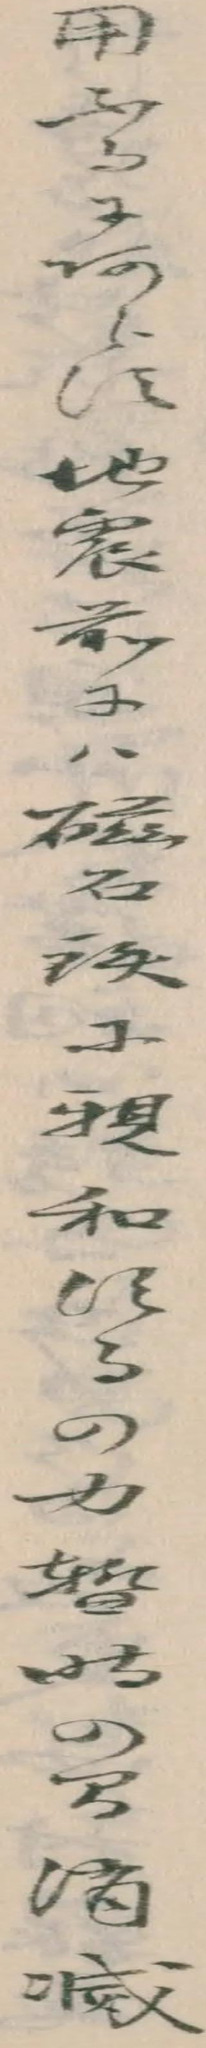用ふるにあらす地震前には磁石鉄に親和するの力暫時の間消滅
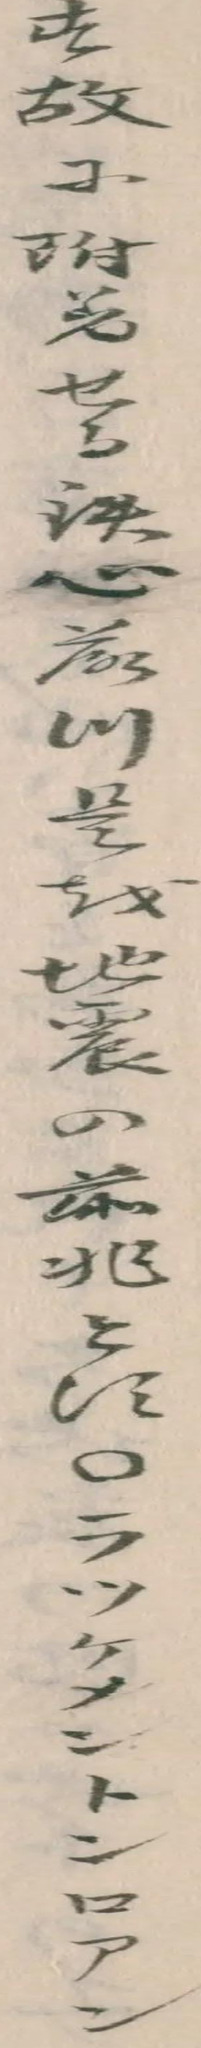す故に附着せる鉄心落つ是を地震の前兆とす〇ラツケメントンロアン
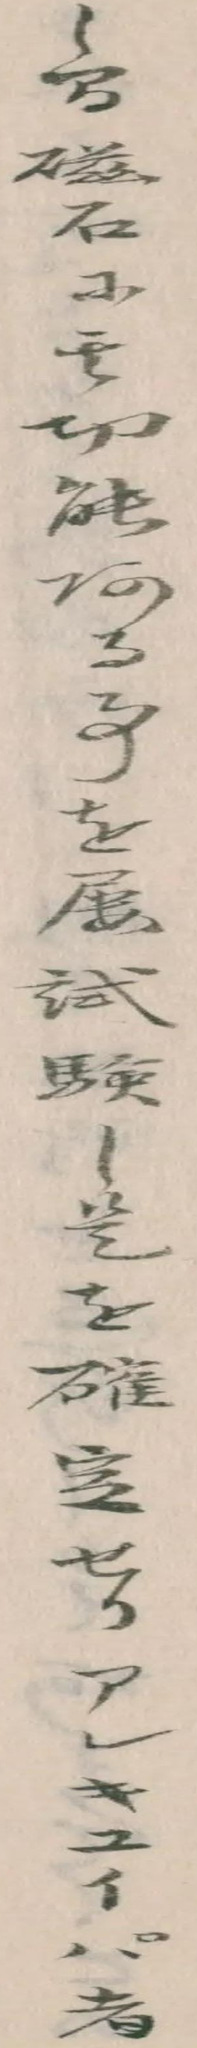し間磁石に其切のある事を屡試験し是を確定せりアレキユイパは
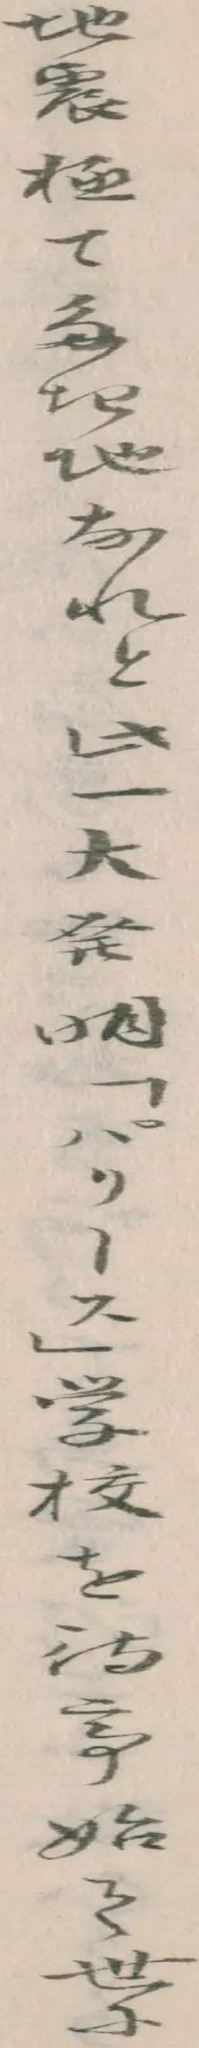地震極て多き地なれと此一大発明「パリース」学校を待て始て世に
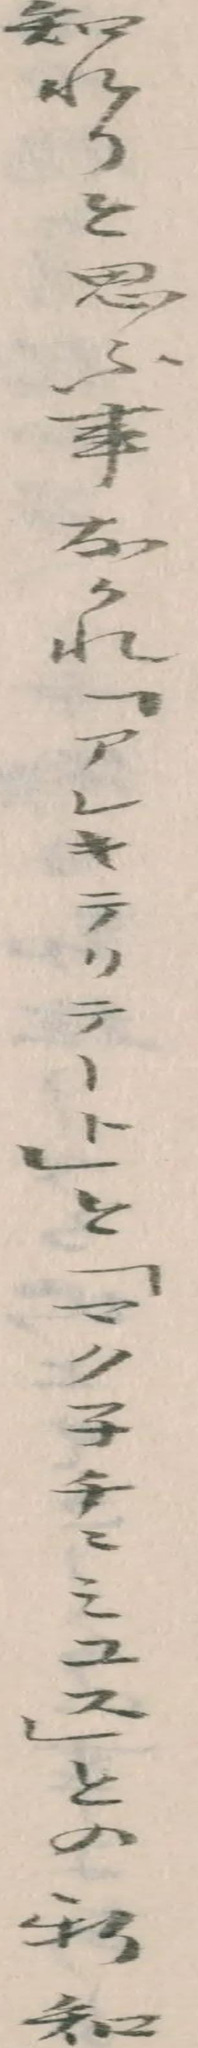知れりと思ふ事なかれ「アレキテリテート」と「マクネチニミユス」との新知
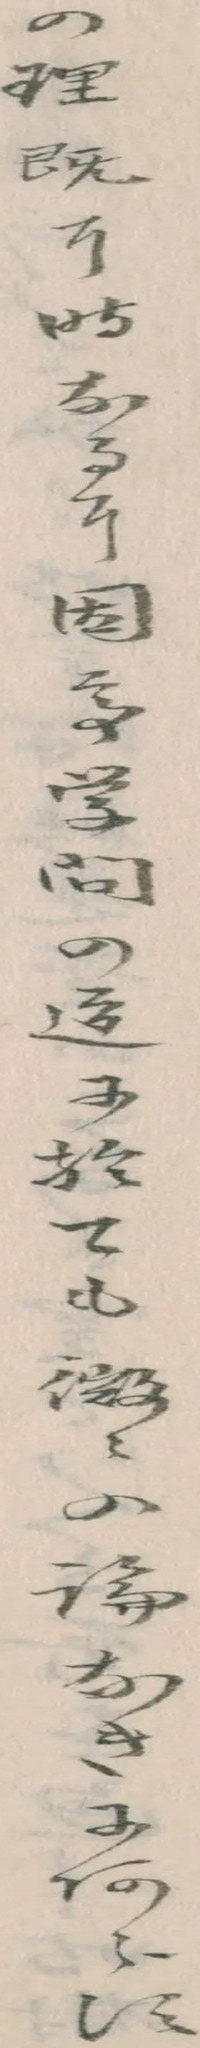の理既に時なるに因て学問の道に於ても微々の論なきにあらす
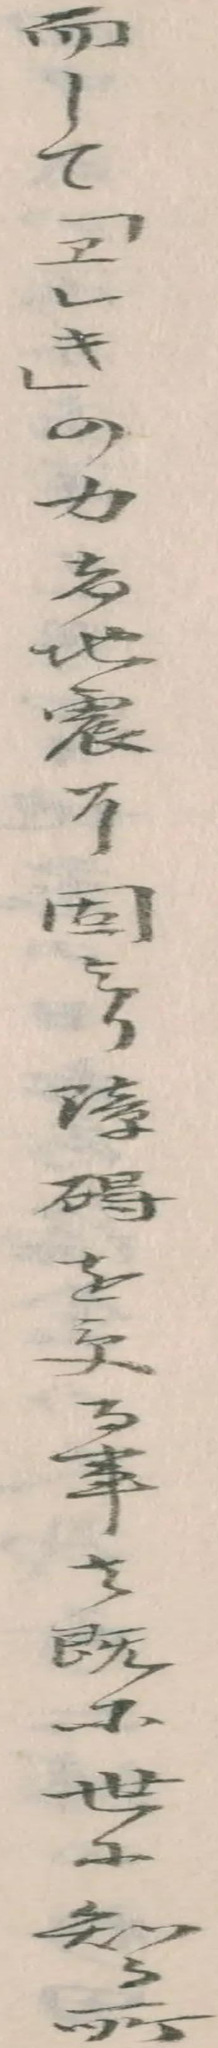而して「ヱレキ」の力は地震に固より障碍を受る事其既に世に知る所
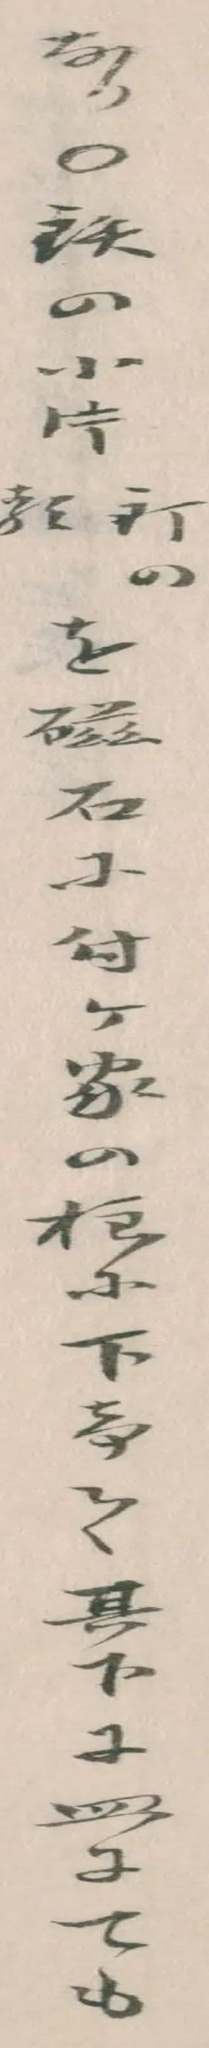なり〇鉄の小片釘の類を磁石に付ケ家の垣に下けて其下に皿にても
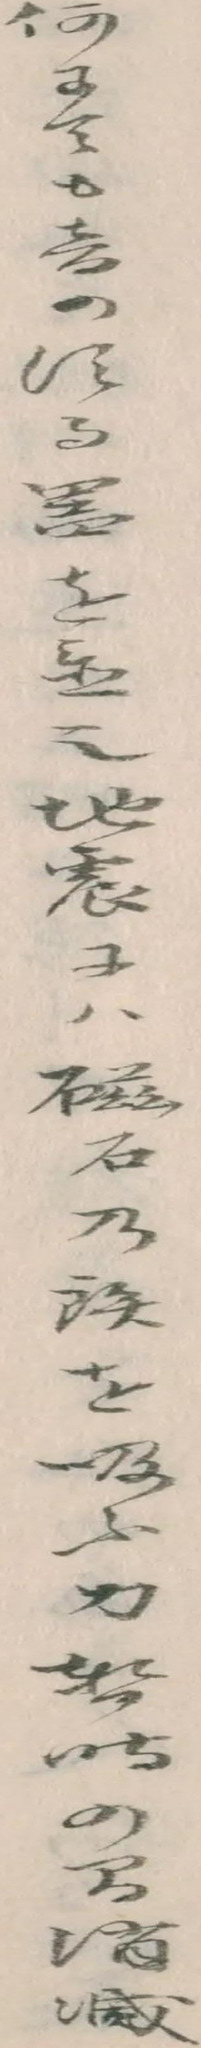何にても音のする器を置之地震には磁石の鉄を吸う力暫時の間消滅
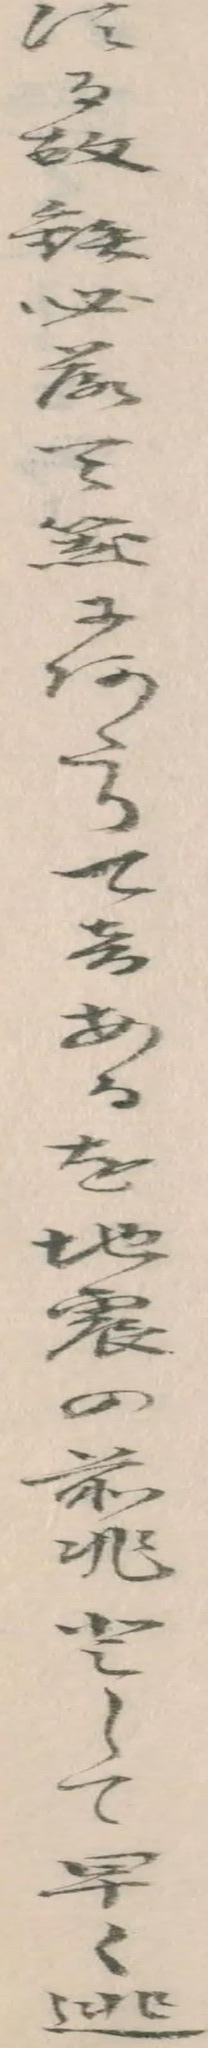する故鉄必落て器にあたりて音あるを地震の前兆として早く逃

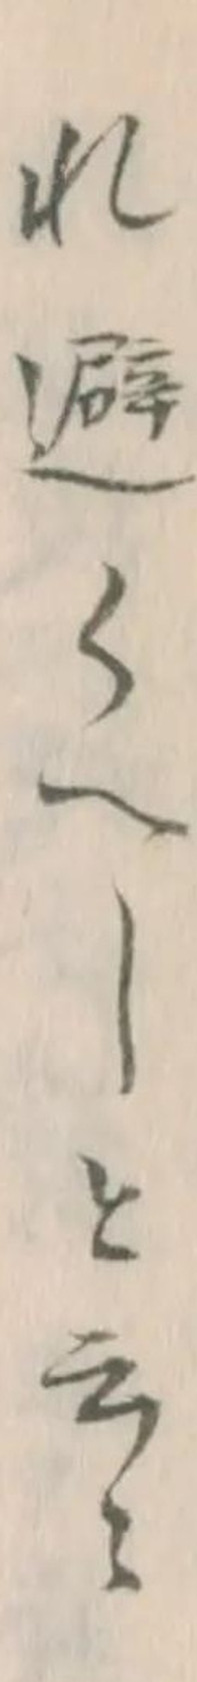れ避くへしと云々
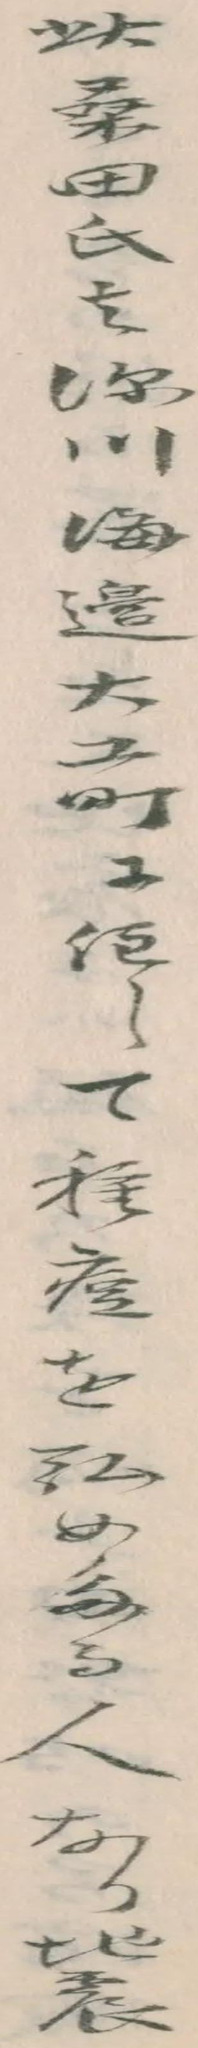此桑田氏は深川海邊大工町に住して種痘を弘めたる人なり地震
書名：地災撮要. 巻7-9(地震之部)
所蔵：国立国会図書館 National Diet Library, JAPAN
